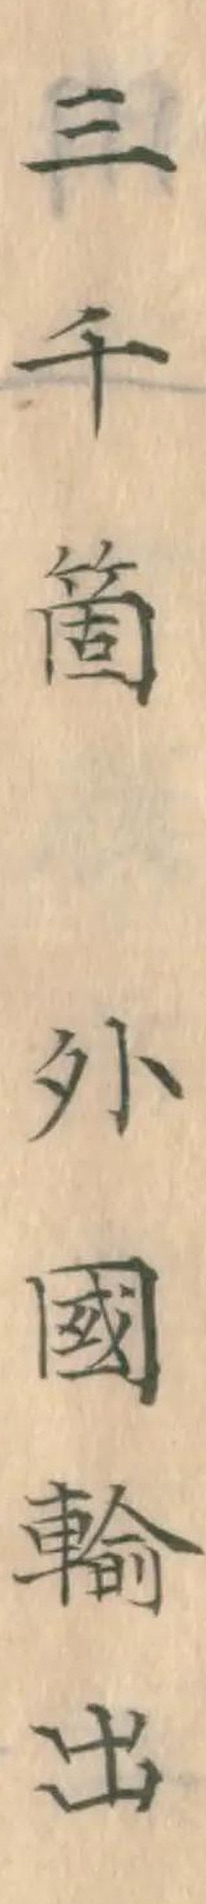三千箇外国輸出
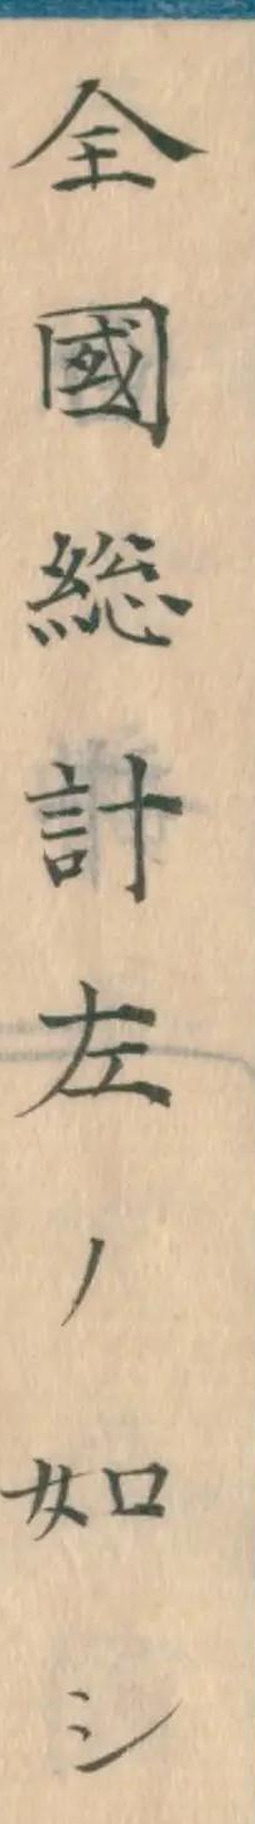全国総計左ノ如シ
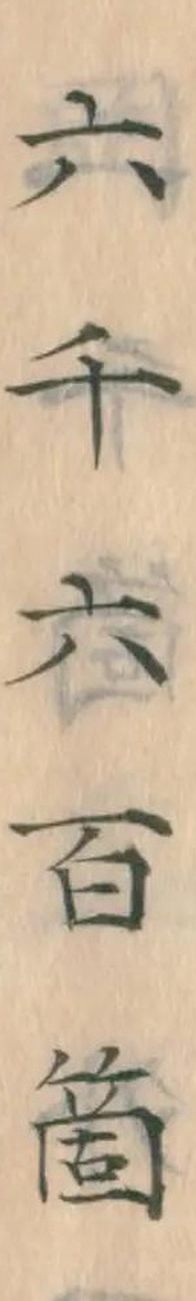六千六百箇
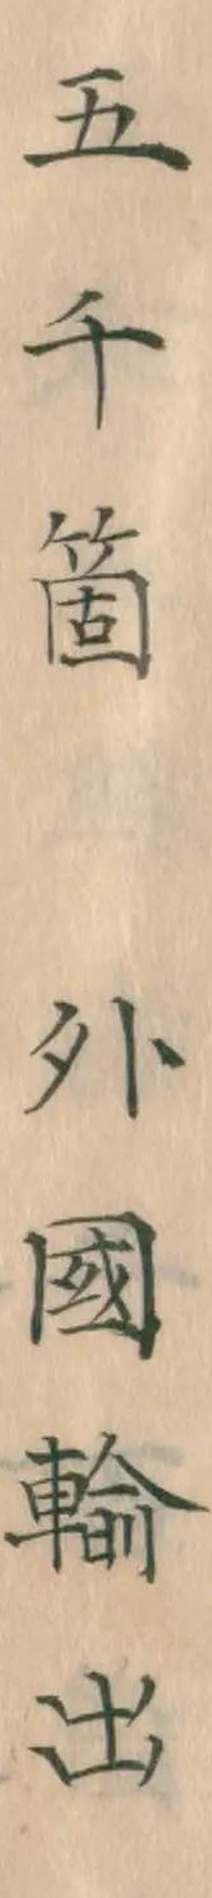五千箇外国輸出
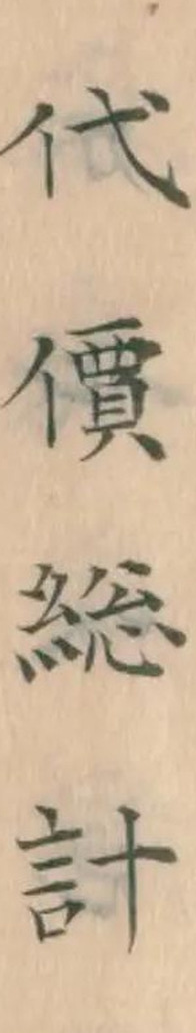代価総計
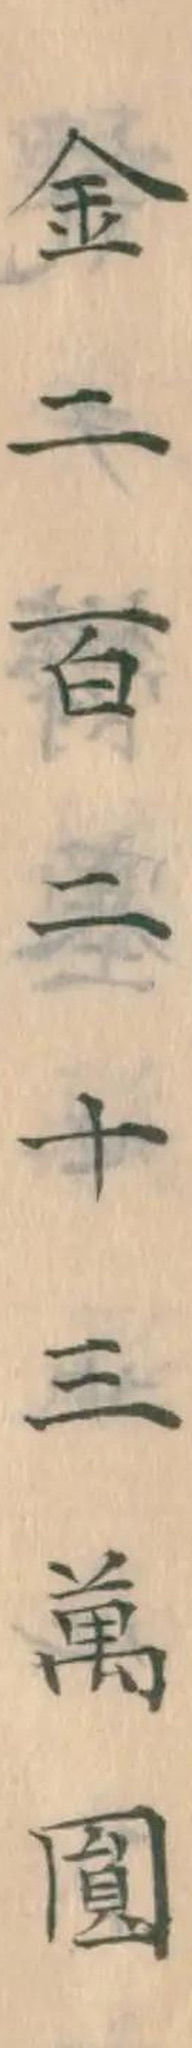金二百二十三万円
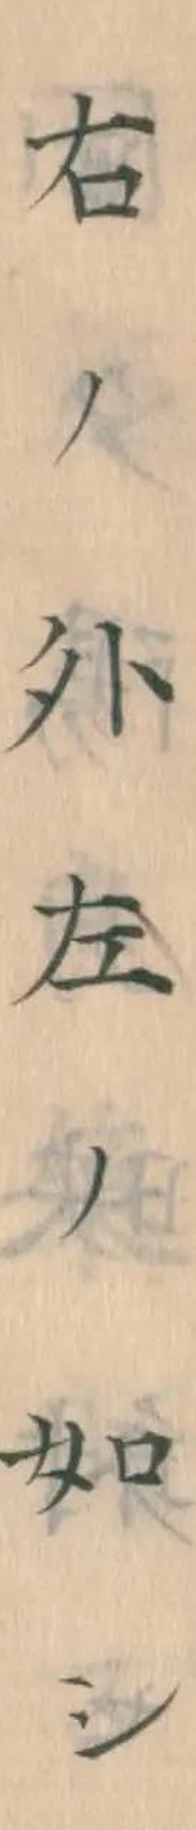右ノ外左ノ如シ
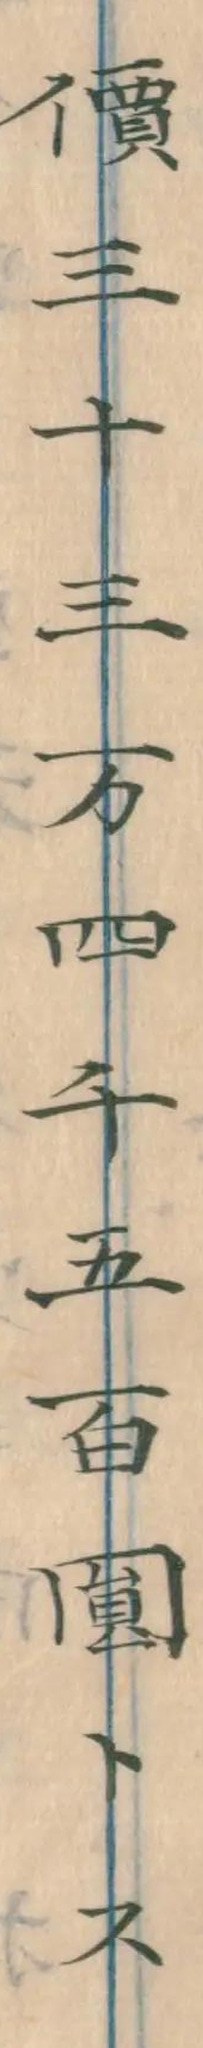├価三十三万四千五百円トス
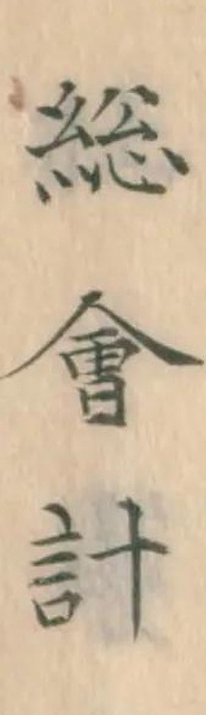総会計
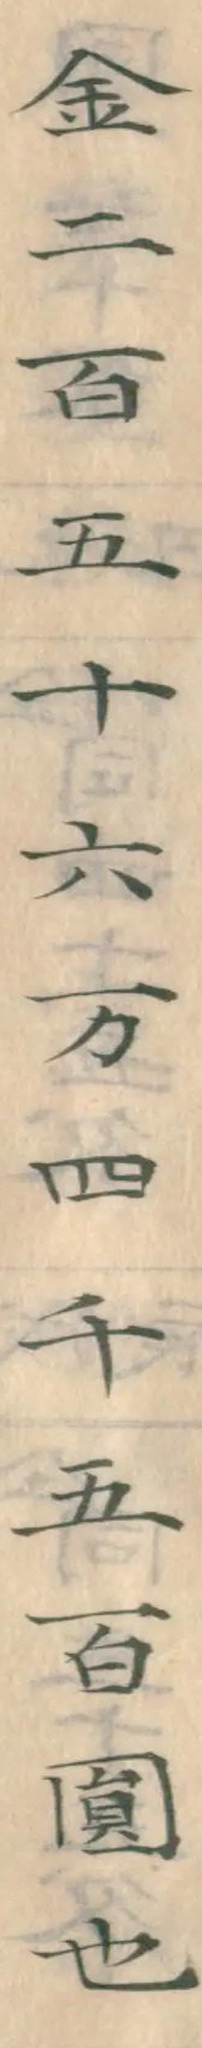金二百五十六万四千五百円也

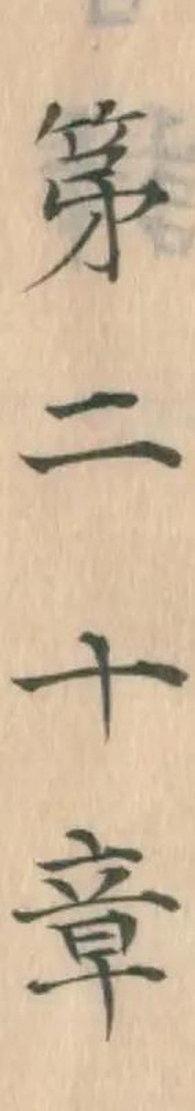第二十章
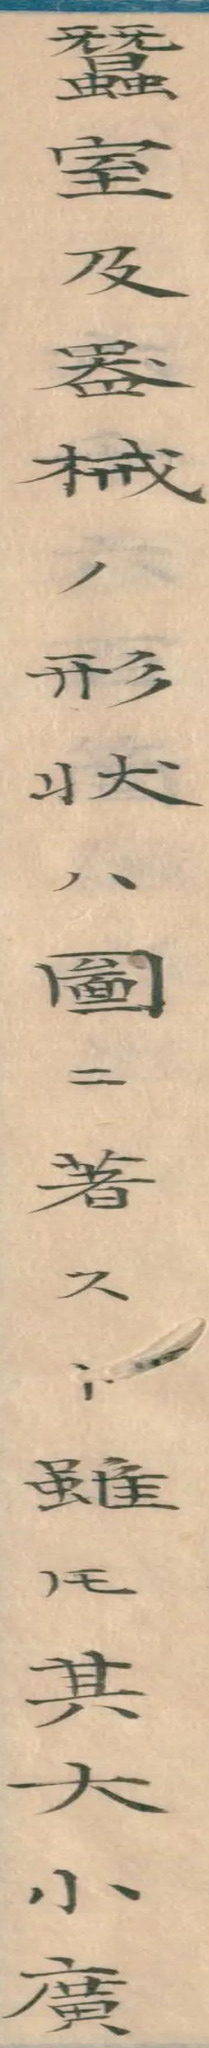蚕室及器械ノ形状ハ図ニ著スト雖トモ其大小広
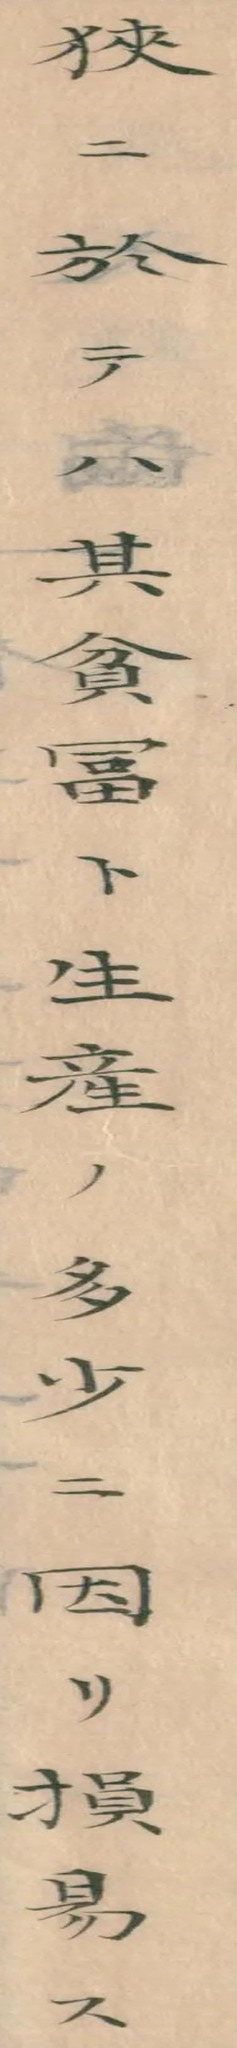狭ニ於テハ其貧富ト生産ノ多少ニ因リ損易ス
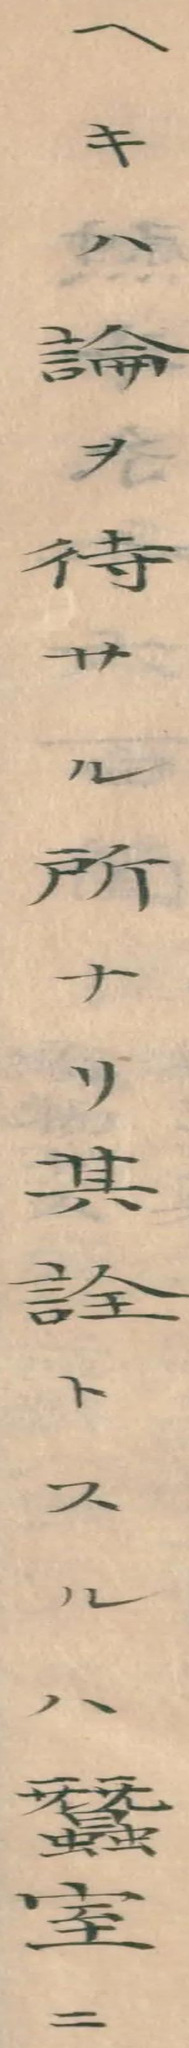ヘキハ論ヲ待サル所ナリ其詮トスルハ蚕室ニ
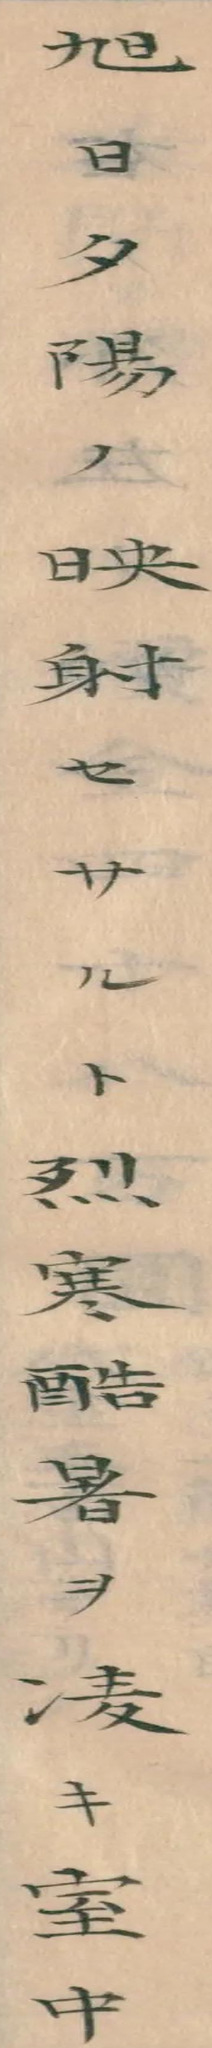旭日夕陽ノ映射セサルト烈寒酷暑ヲ凌キ室中
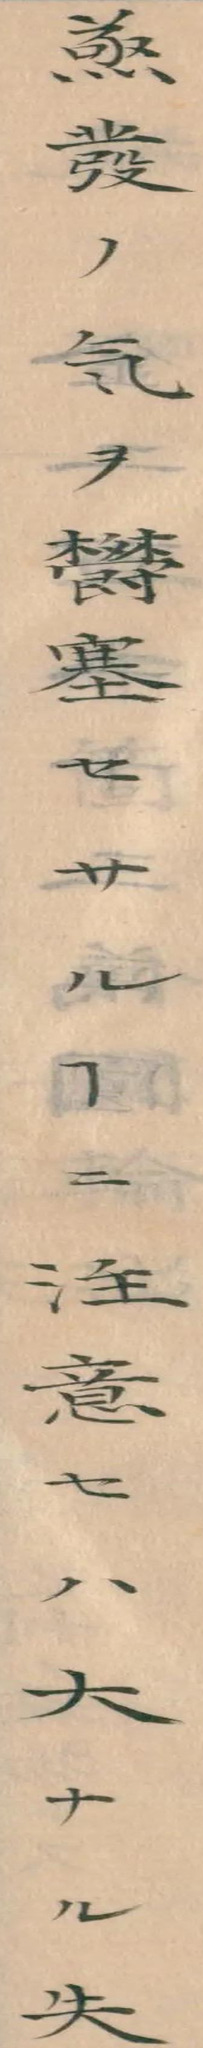蒸発ノ気ヲ鬱塞セサルコトニ注意セハ大ナル失
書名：蚕桑集成
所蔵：国立国会図書館 National Diet Library, JAPAN
